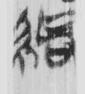紿
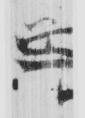正
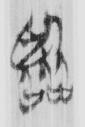臨
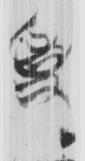事
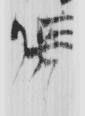倀
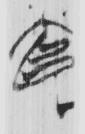官
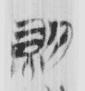則
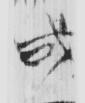或
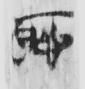恥
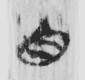自
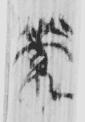縈
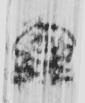{宀毳}
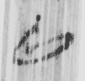㠯（以）
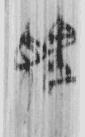{見垔}
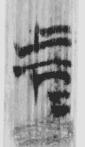{上下}
